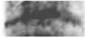一
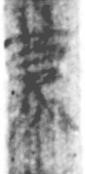黃
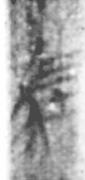○（牡）
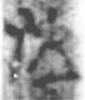○（左）
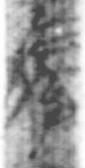○（服）
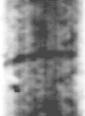一
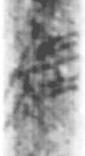○（牡）
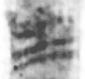爲
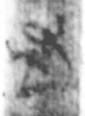○（右）
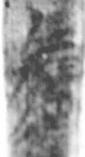○（服）
